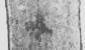十
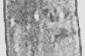二
